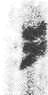曰
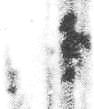易（狄）
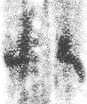夫
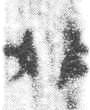戔
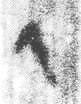人
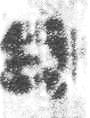剛
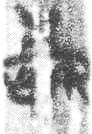○（恃）
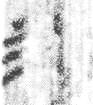而
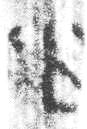○（及）
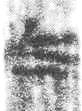於
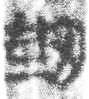型（刑）
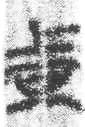者
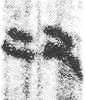又（有）
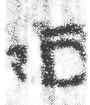○（尚）
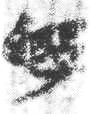孯（賢）
